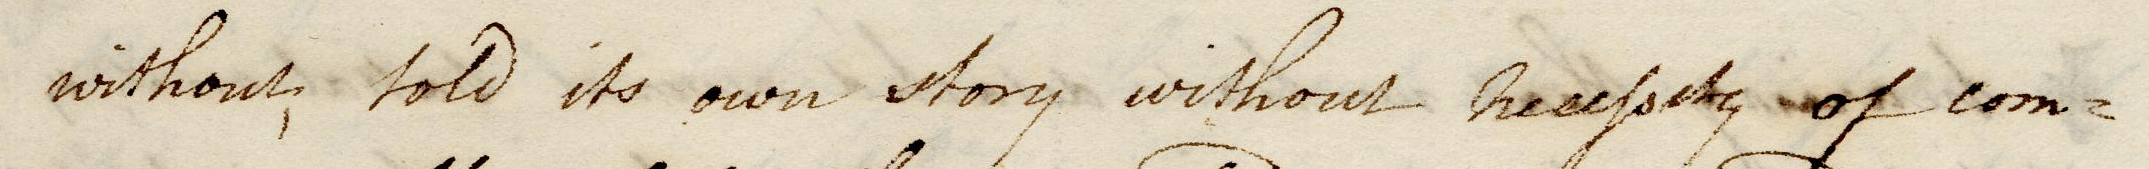without, told its own story without necessity of com-
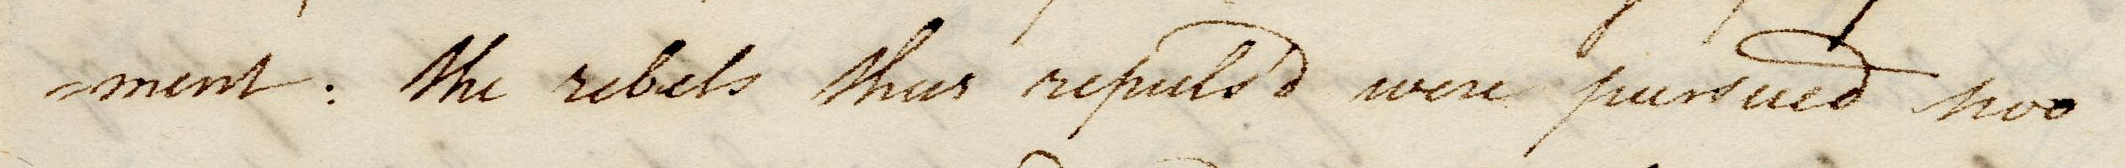-ment. the rebels thus repuls'd were pursued two
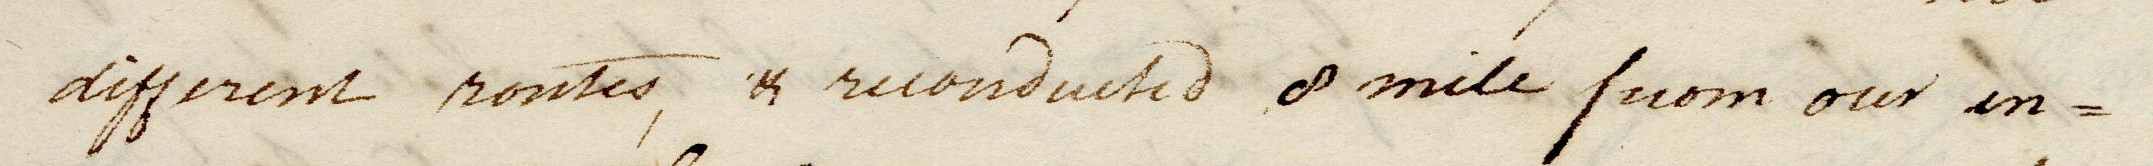different routes, & reconducted 8 mile from our en-
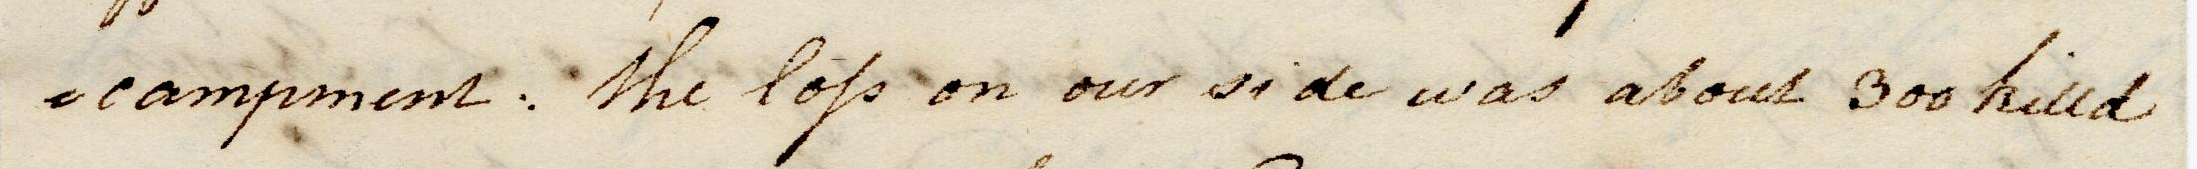-campment: the loss on our side was about 300 killd
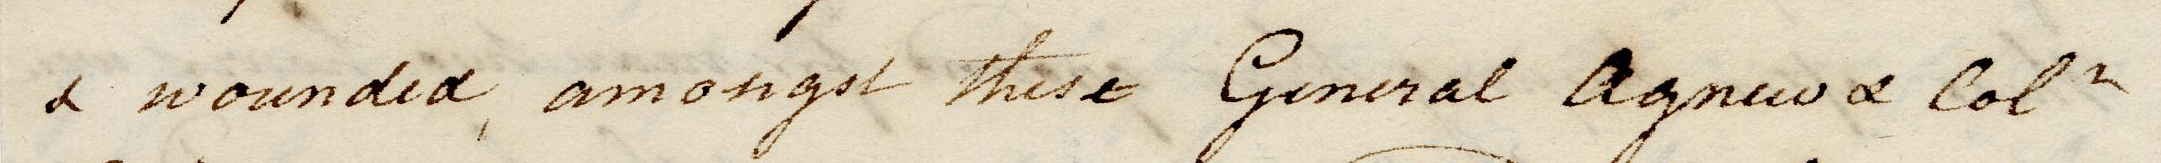& wounded amongst these General Agnew & Col^n
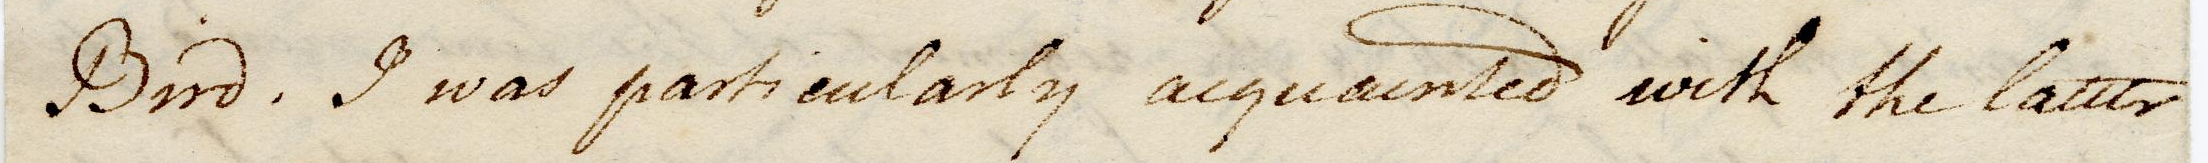Bird. I was particularly acquainted with the latter
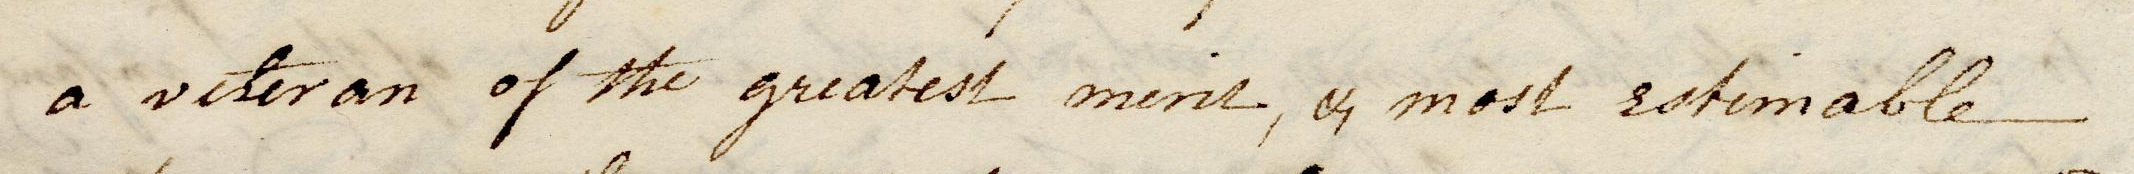a veteran of the greatest merit, & most estimable
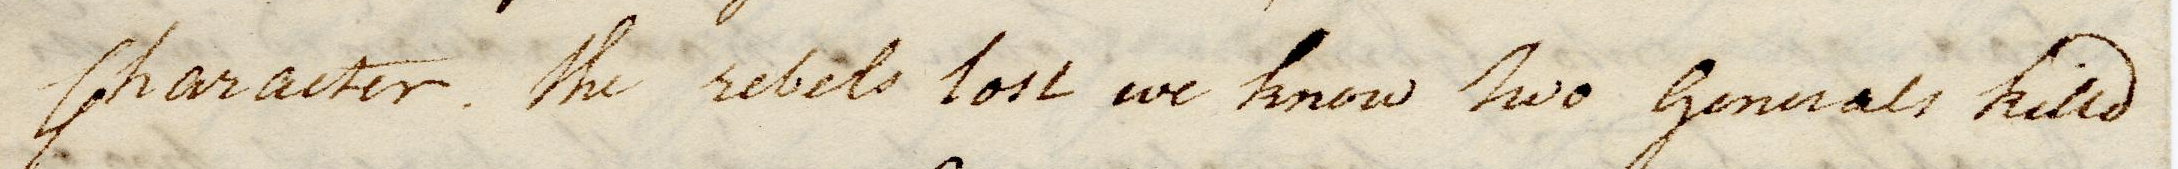Character, the rebels lost we know two Generals killd
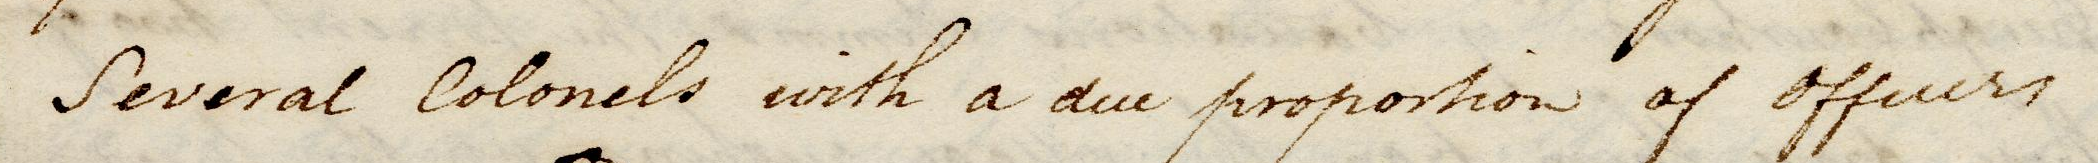Several Colonels with a due proportion of Officers
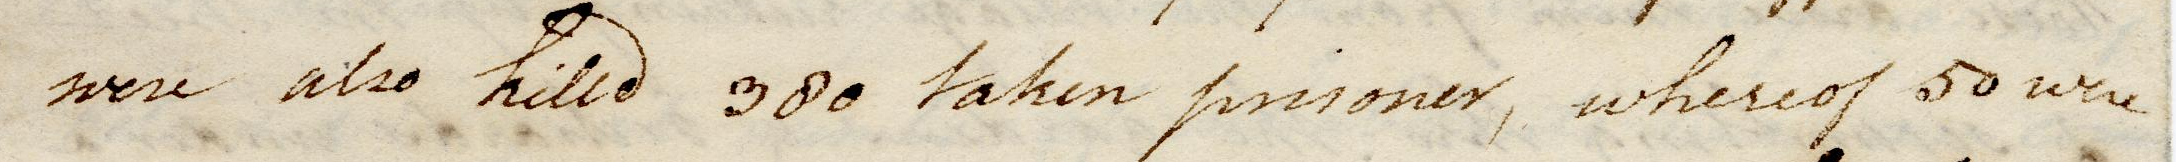were also killd 380 taken prisoner, whereof 50 were
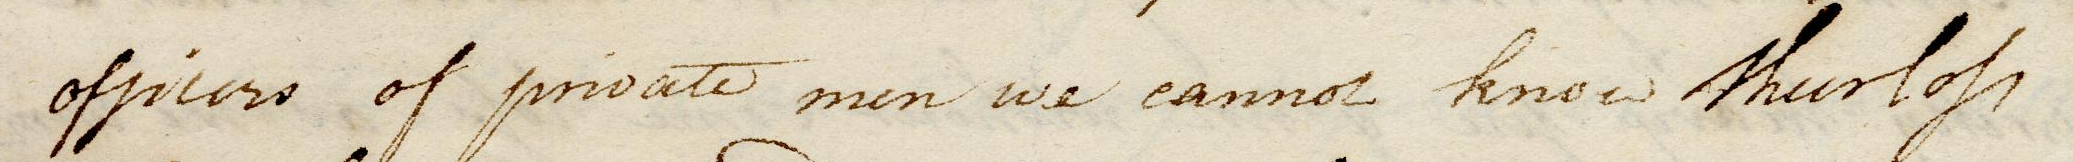officers of private men we cannot know their loss
